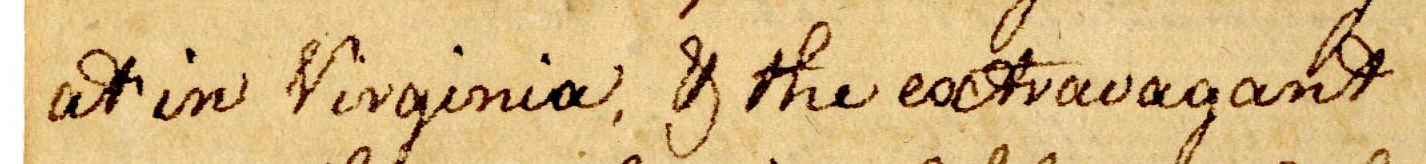at in Virginia, & the extravagant
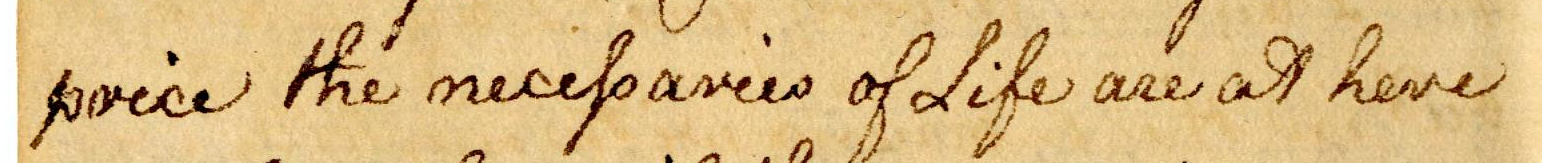price the necessaries of Life are at here
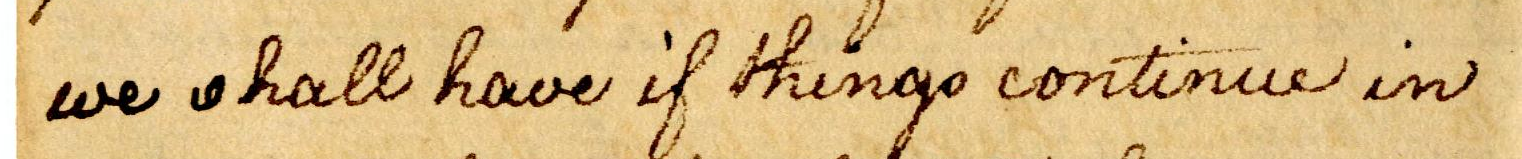we shall have if things continue in
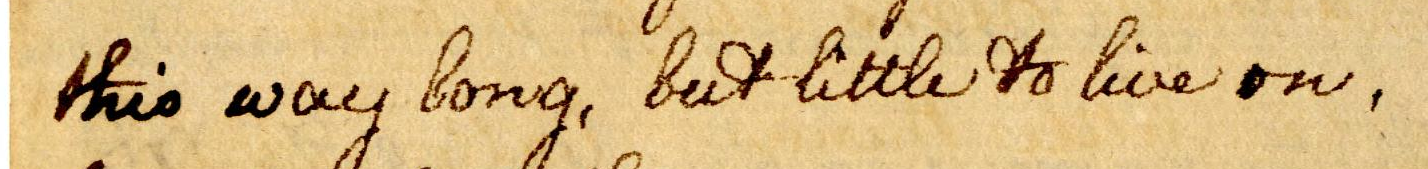this way long, but little to live on,
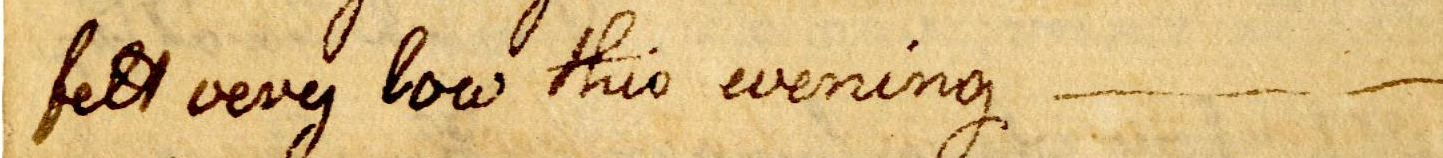felt very low this evening-
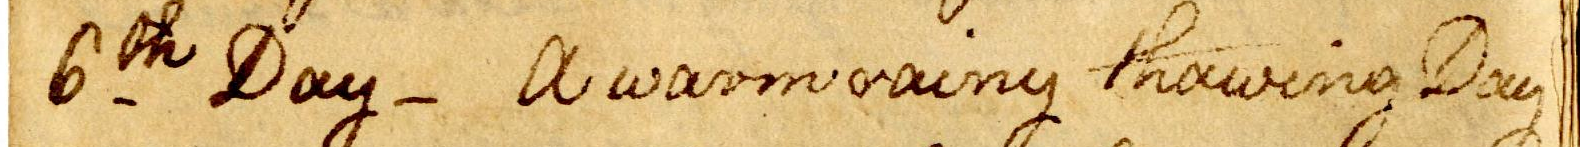6^th Day- A warm rainy thawing Day
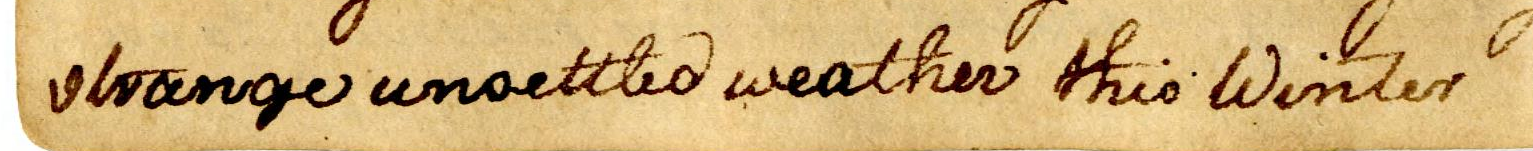strange unsettled weather this Winter
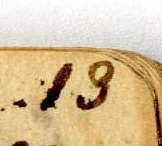13
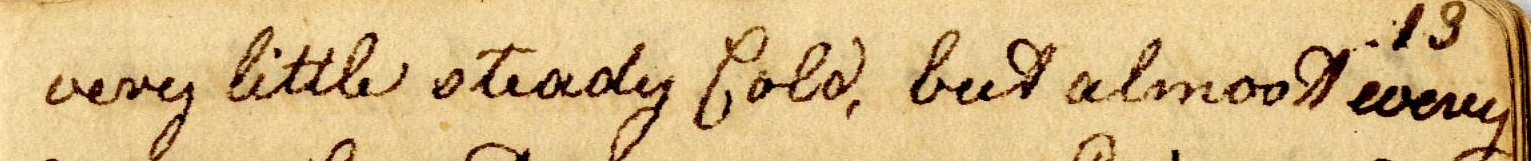very little steady Cold, but almost every
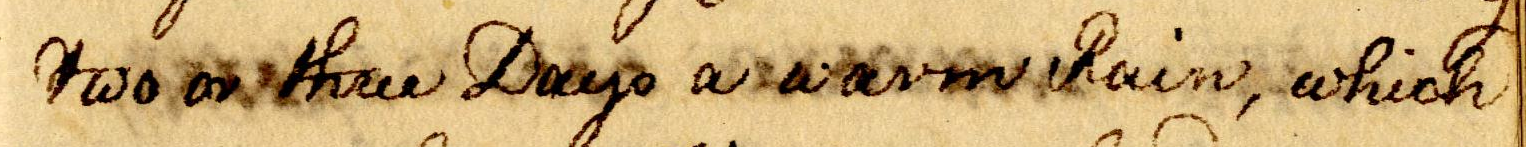two or three Days a warm Rain, which
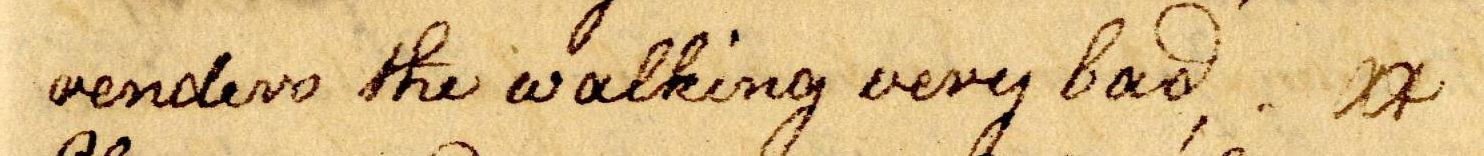renders the walking very bad,- At
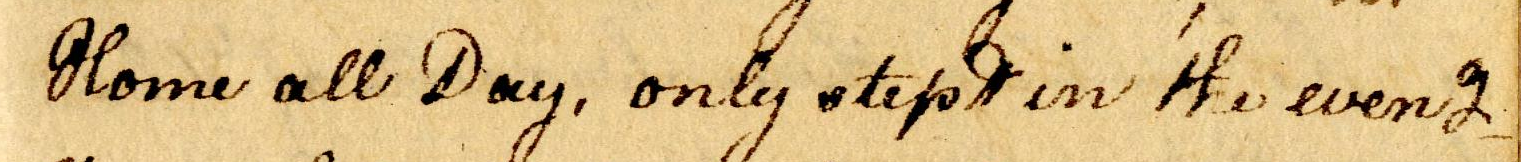Home all day, only stept in the even^g
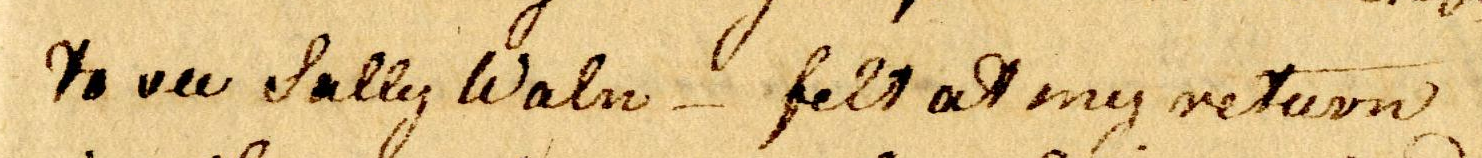to see Sally Waln- felt at my return
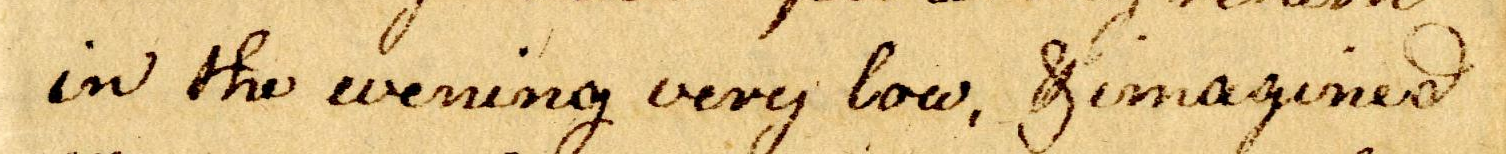in the evening very low, & imagined
